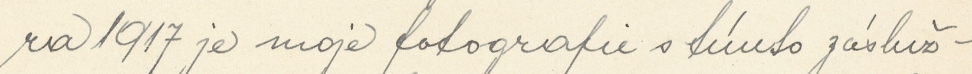ra 1917 je moje fotografie s tímto zásluž-
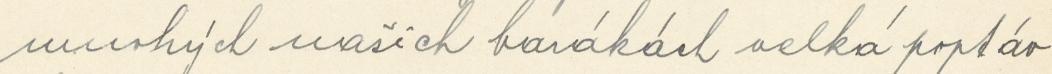mnohých našich barákách velká poptáv-
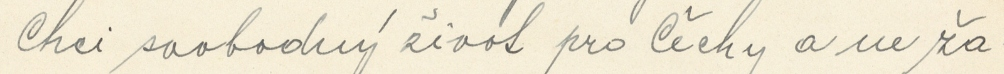Chci svobodný život pro Čechy a ne ža-
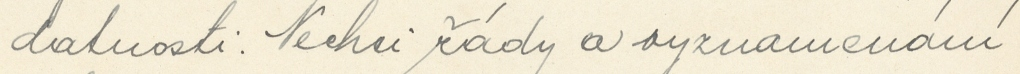datnosti. Nechci řády a vyznamenání.
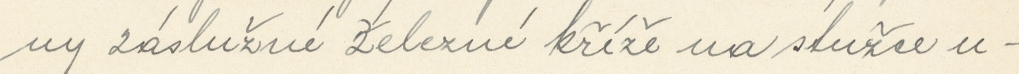ny záslužné železné kříže na stužce u-
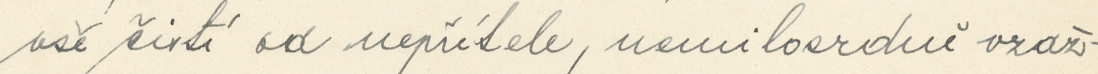vše čistí od nepřítele, nemilosrdně vraž-
